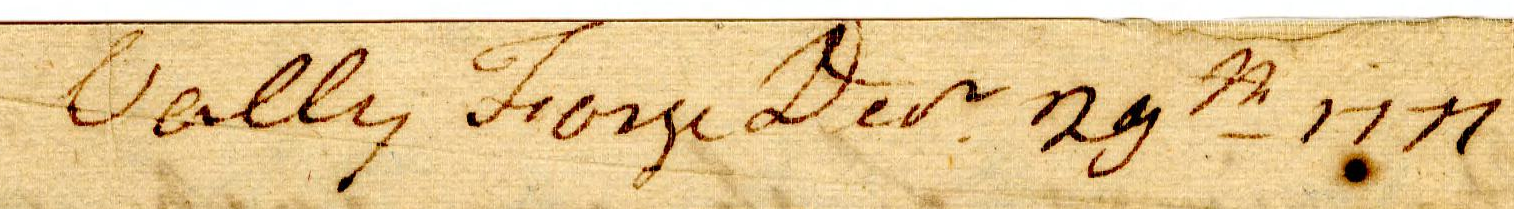Vally Forge Dec^r 29^th 1777
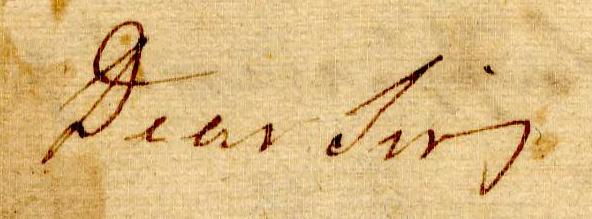Dear Sir,
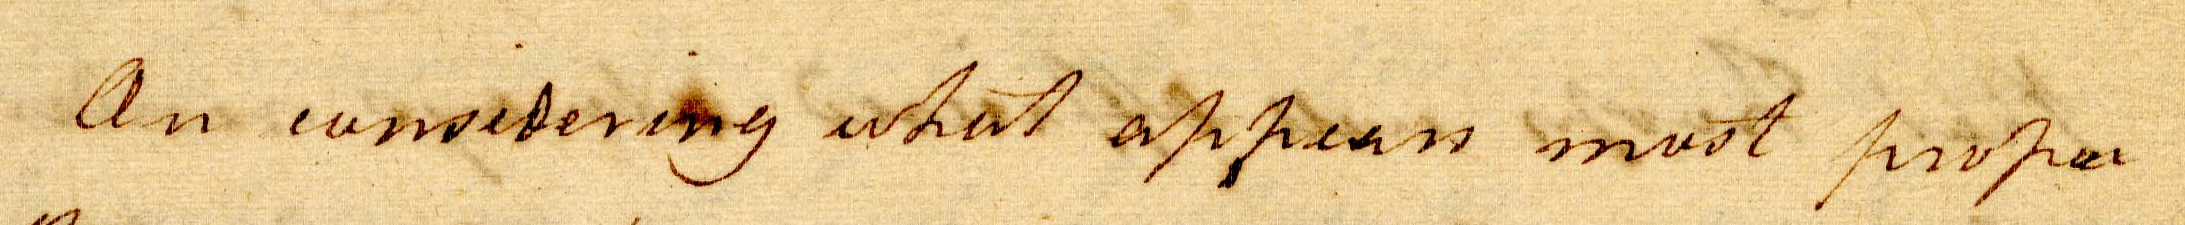On considering what appears most proper
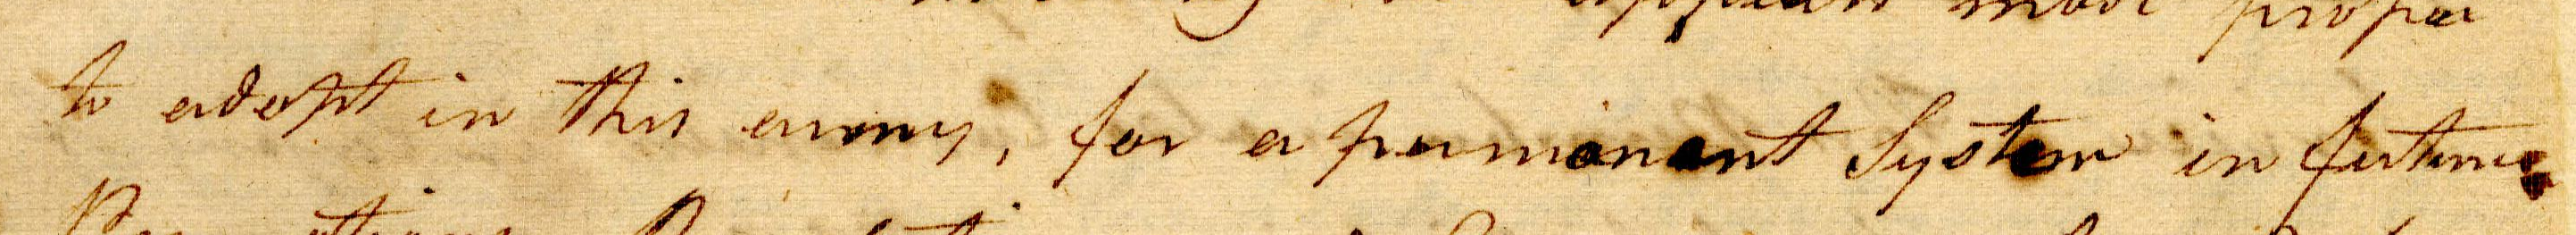to adopt in this army, for a prominent System in future
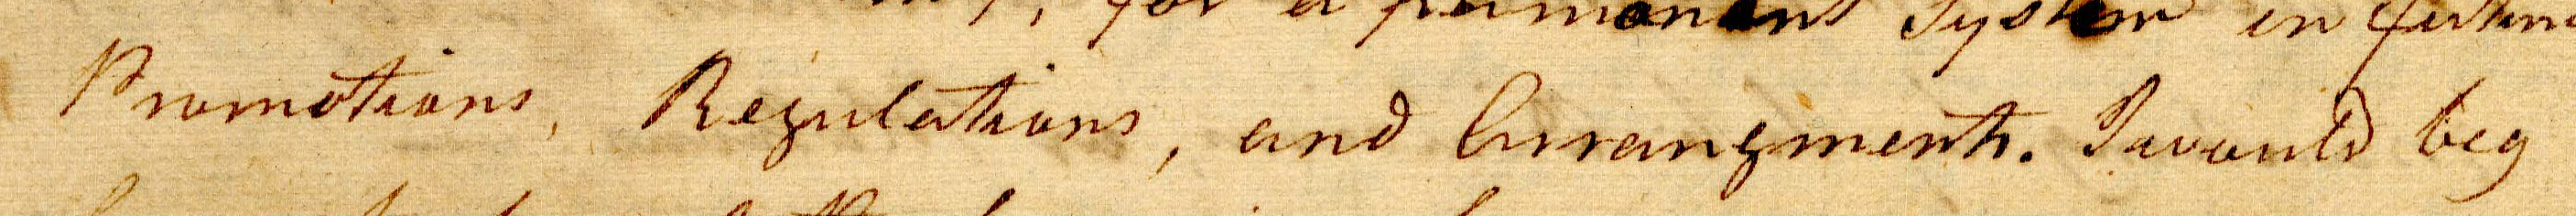Promotions, Regulations, and Arrangements. I would beg
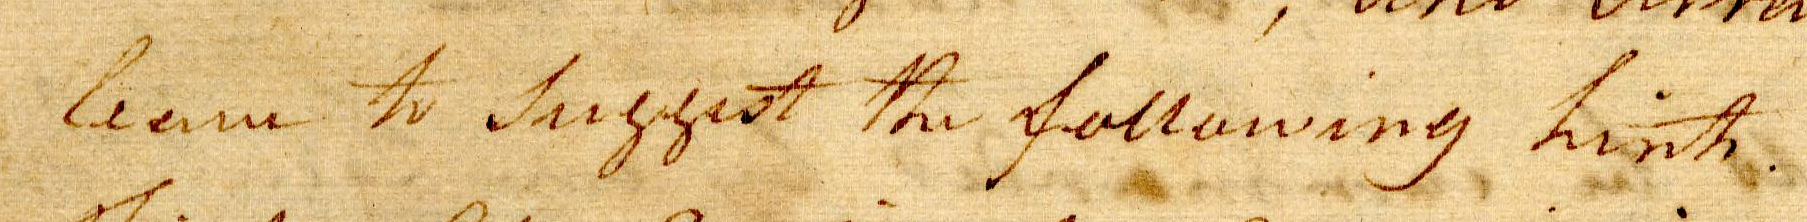leave to suggest the following hints.
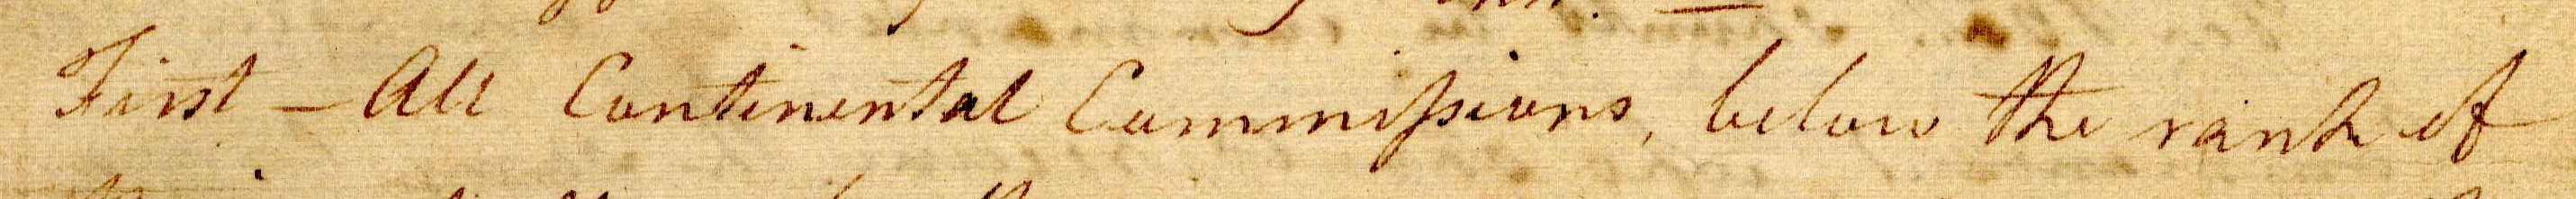First- All continental Commissions below the rank of
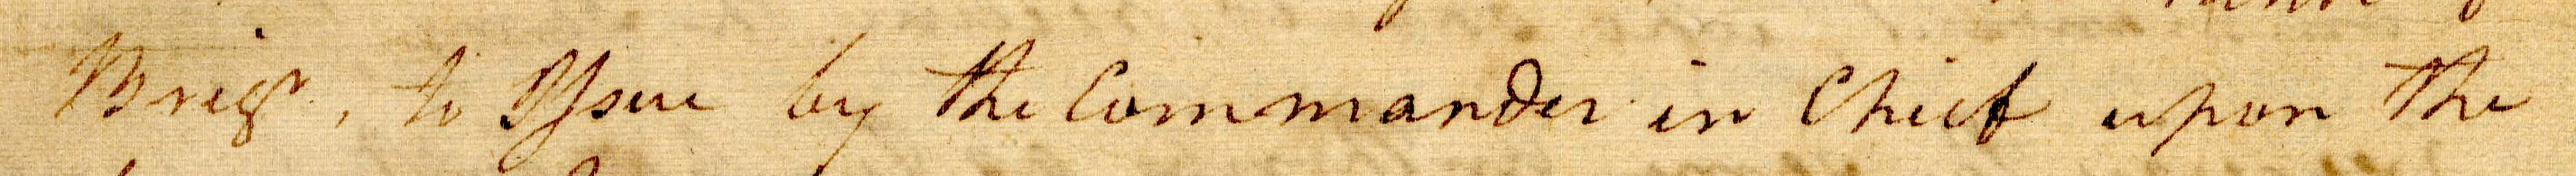Brig^r, to Issue by Commander in Chief upon the
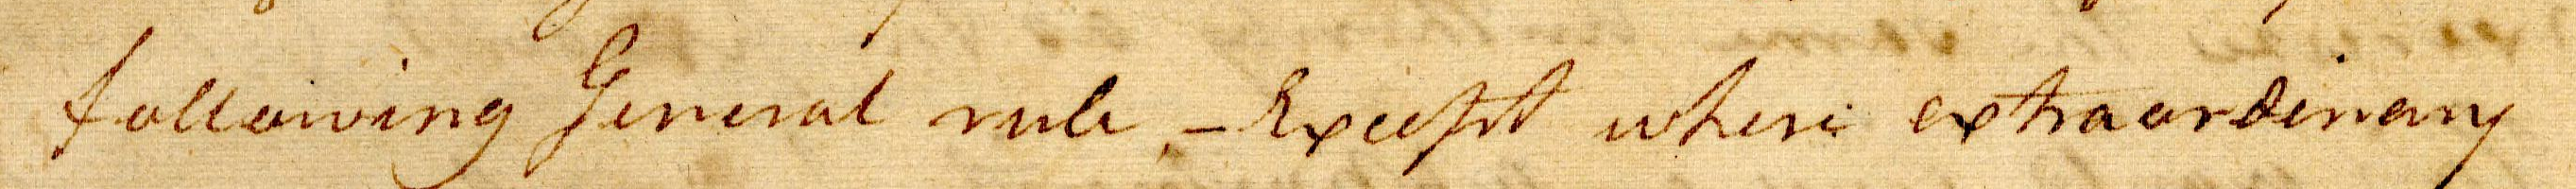following General rule- Except where extraordinary
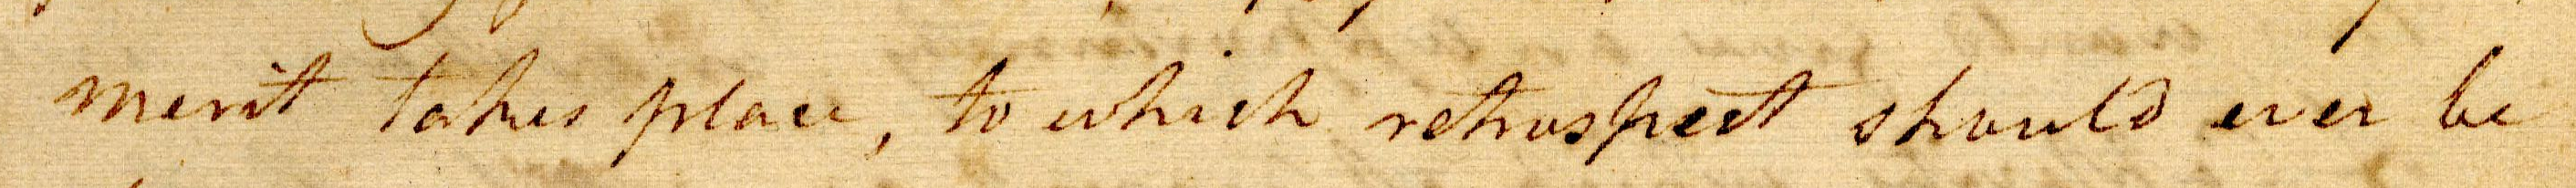merit takes place, to which retrospect should ever be
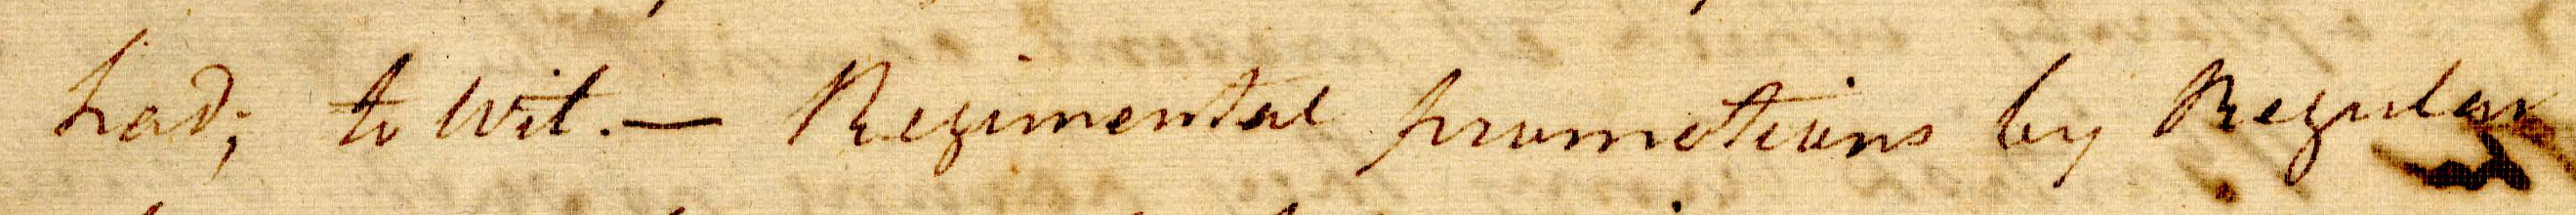had; to wit.- Regimental promotions by Regular
